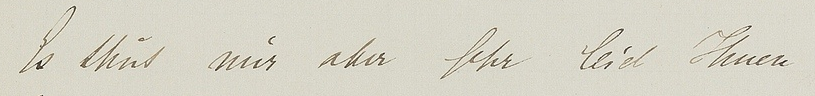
Es thut mir aber sehr leid Ihnen
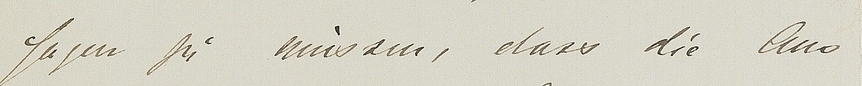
sagen zu müssen, dass die Aus-
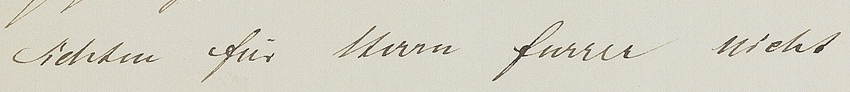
sichten für Herrn Furrer nicht
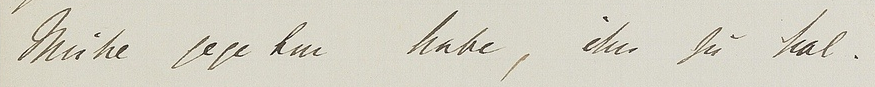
Mühe gegeben habe, ihn zu hal-
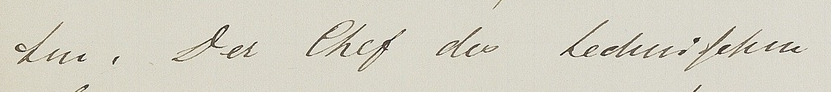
ten. Der Chef des technischen
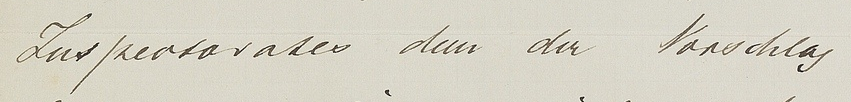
Inspectorates dem der Vorschlag
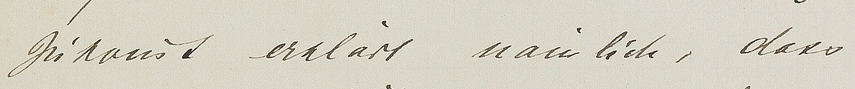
zukommt erklärt nämlich, dass
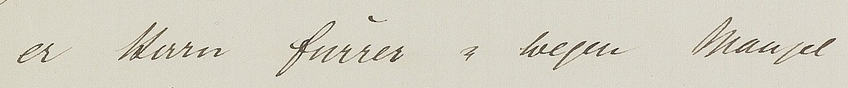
er Herrn Furrer «wegen Mangel
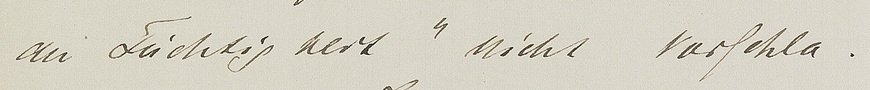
an Tüchtigkeit» nicht vorschla-
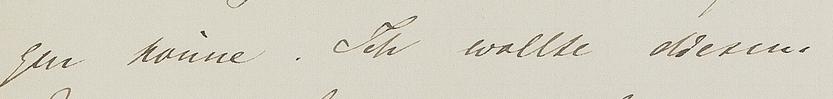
gen könne. Ich wollte diesem
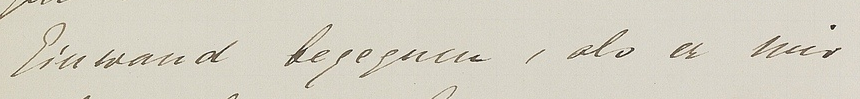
Einwand begegnen, als er mir
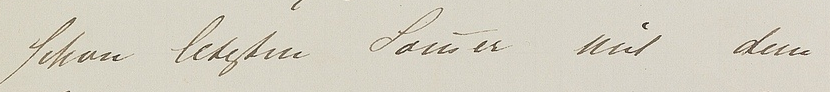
schon letzten Sommer mit dem
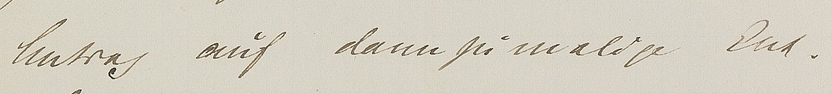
Antrag auf dannzumalige Ent-
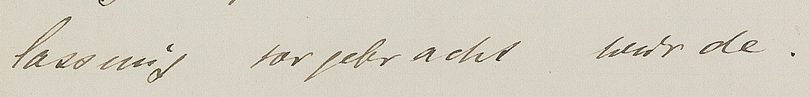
lassung vorgebracht wurde.
